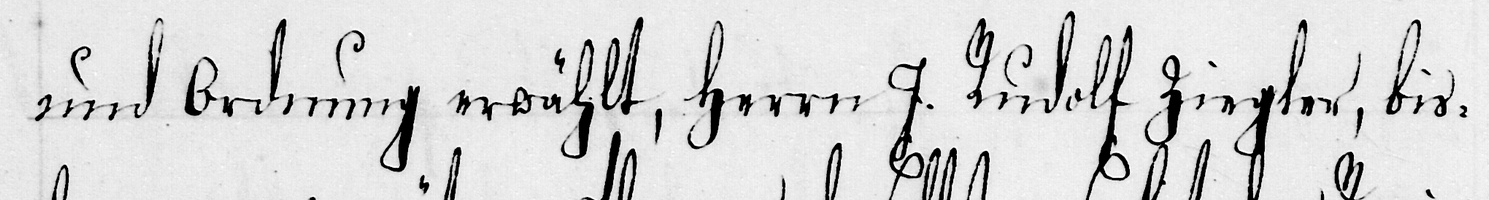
und Ordnung erwählt, Herrn J. Rudolf Ziegler, bis¬
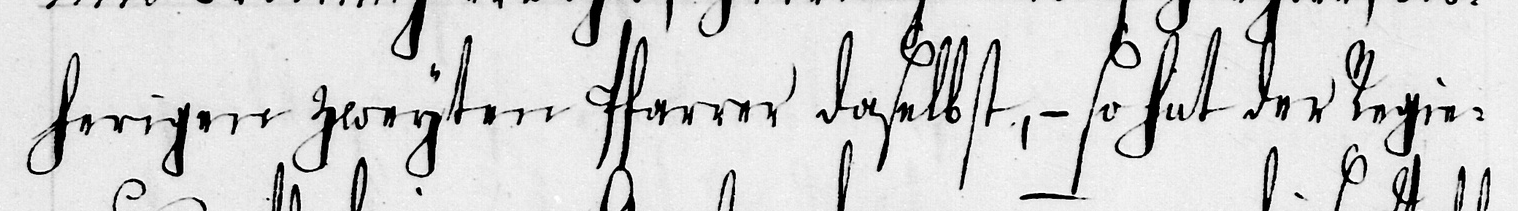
herigen zweyten Pfarrer daselbst, – so hat der Regie¬
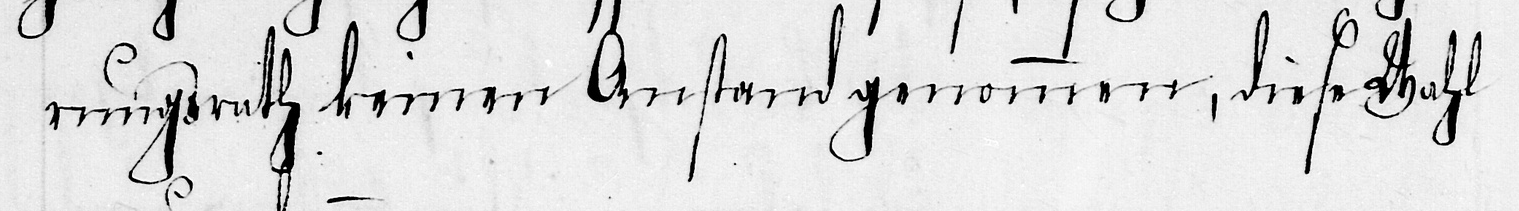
rungsrath keinen Anstand genommen, diese Wahl
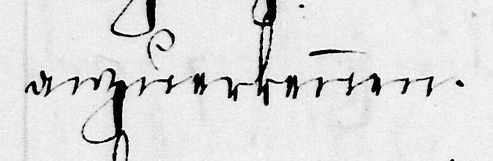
anzuerkennen.
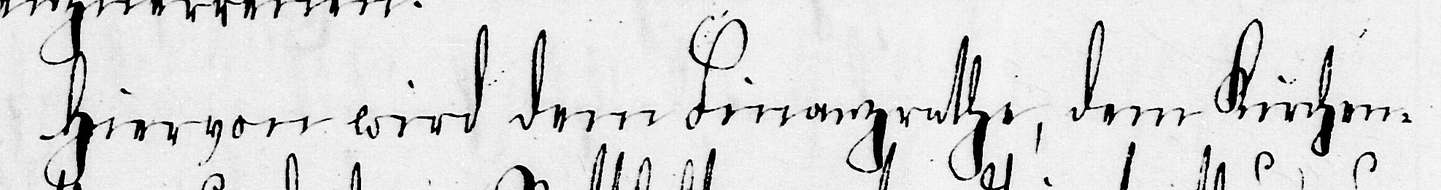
Hiervon wird dem Finanzrathe, dem Kirchen¬
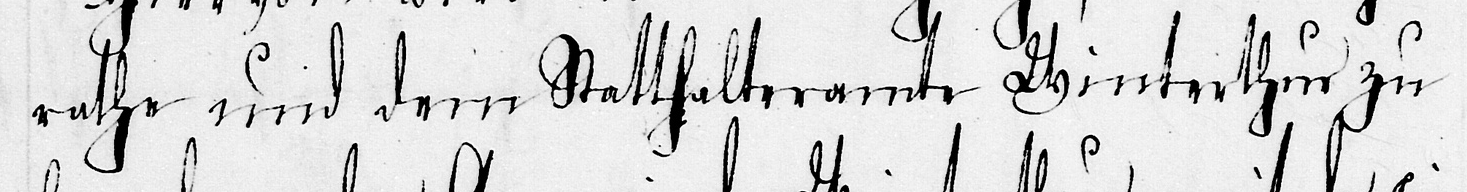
rathe und dem Statthalteramte Winterthur zu
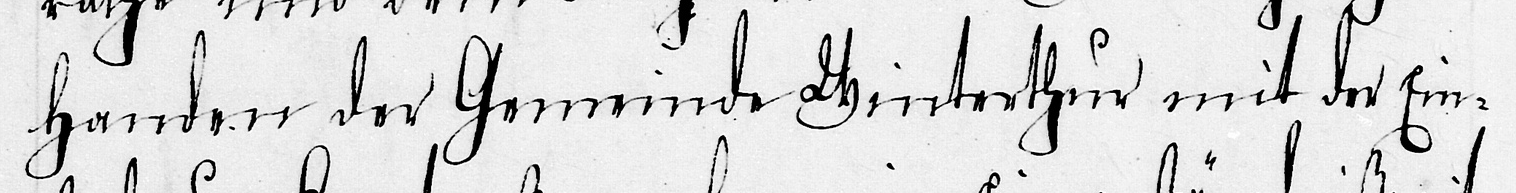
Handen der Gemeinde Winterthur mit der Ein¬
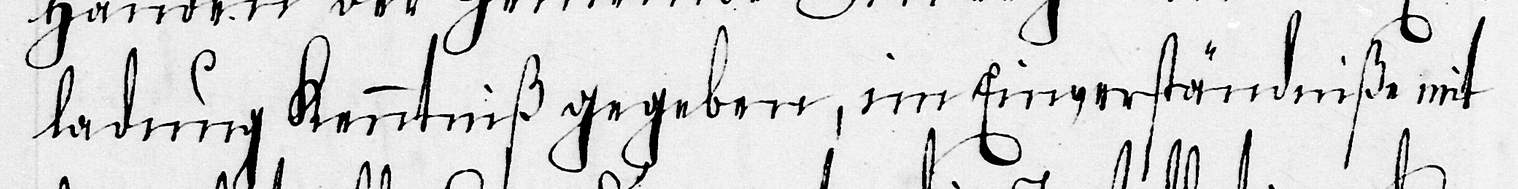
ladung Kenntniß gegeben, im Einverständniße mit
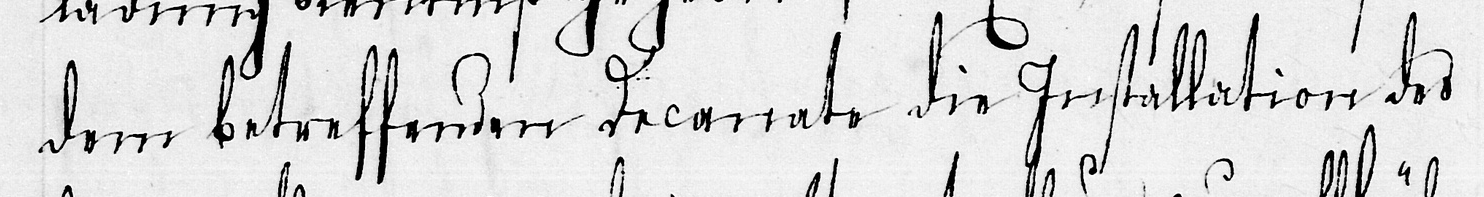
dem betreffenden Decanate die Installation des
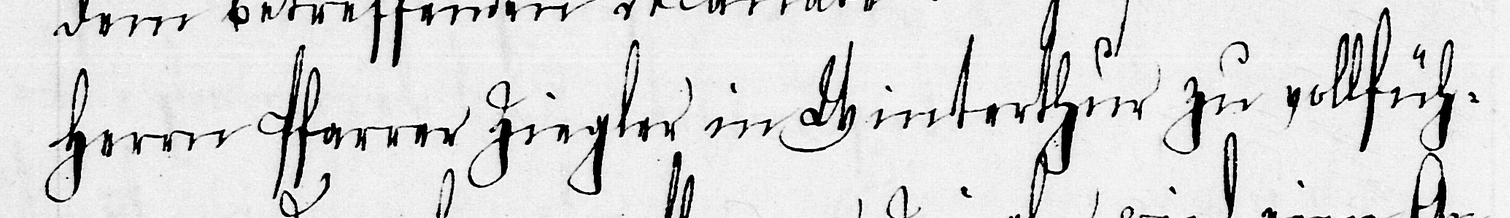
Herrn Pfarrer Ziegler in Winterthur zu vollfüh¬
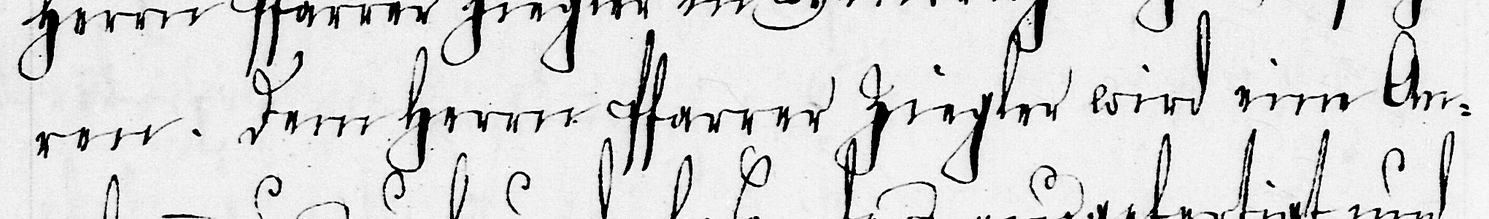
ren. Dem Herrn Pfarrer Ziegler wird eine An¬
